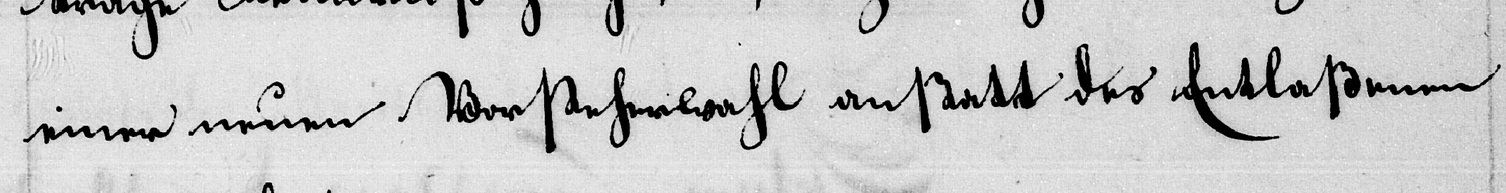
einer neuen Vorsteherwahl anstatt des Entlaßenen
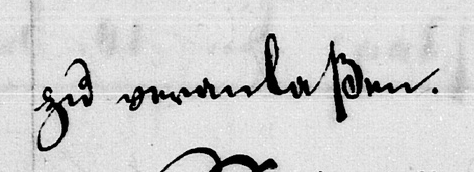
zu veranlaßen.
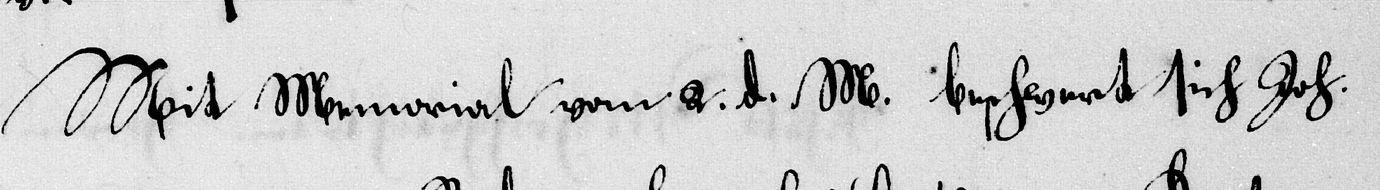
Mit Memorial vom 2. d. M. beschwert sich Joh.
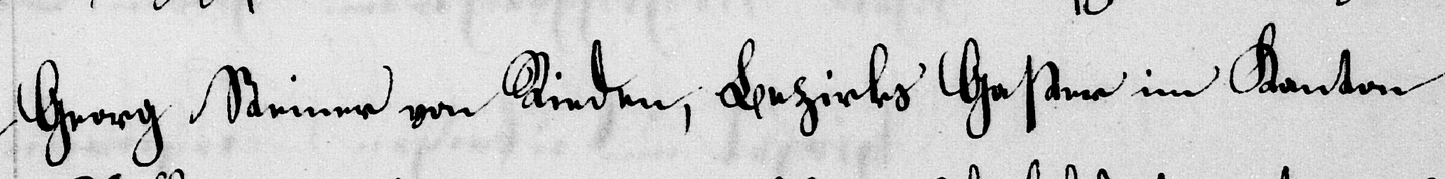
Georg Steiner von Rieden, Bezirks Gaster im Kanton
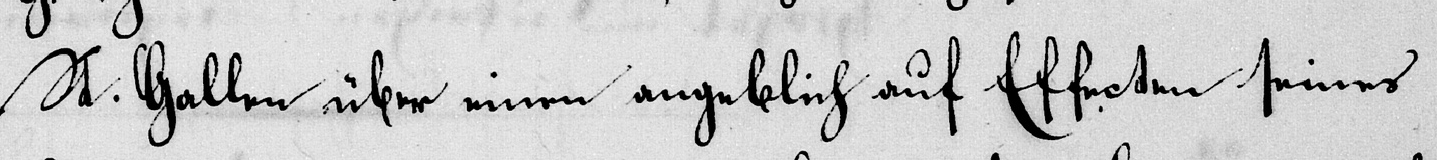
St. Gallen über einen angeblich auf Effecten seines
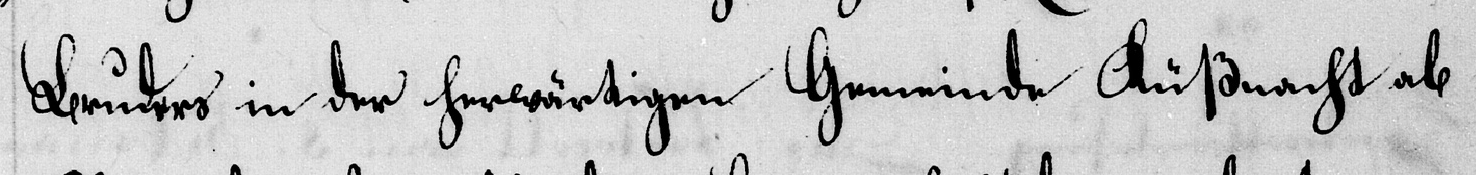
Bruders in der herwärtigen Gemeinde Küßnacht ab
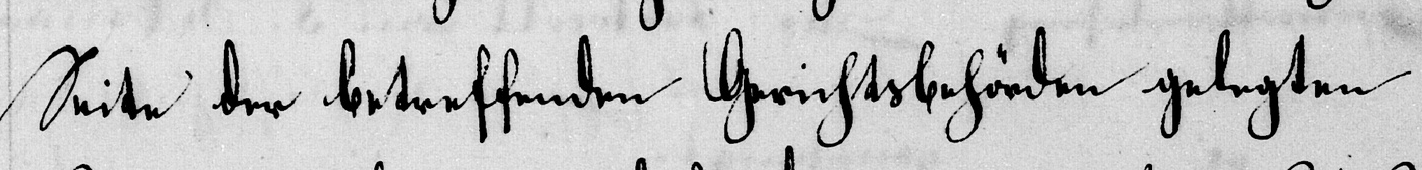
Seite der betreffenden Gerichtsbehörden gelegten
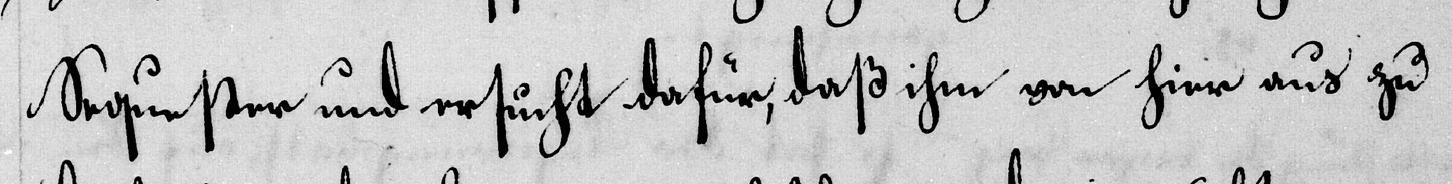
Sequesters und ersucht dafür, daß ihm von hier aus zu
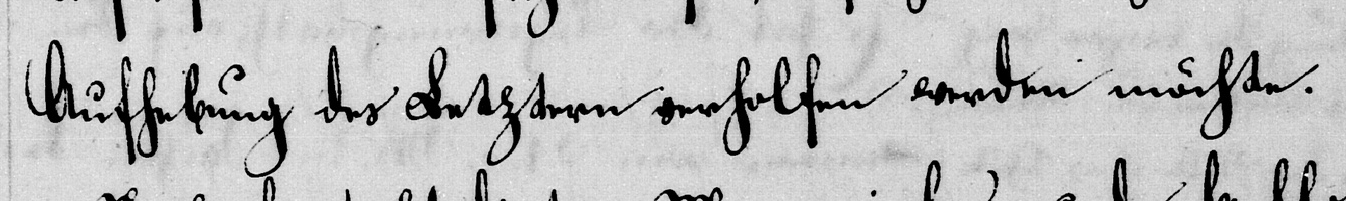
Aufhebung des Letztern verholfen werden möchte.
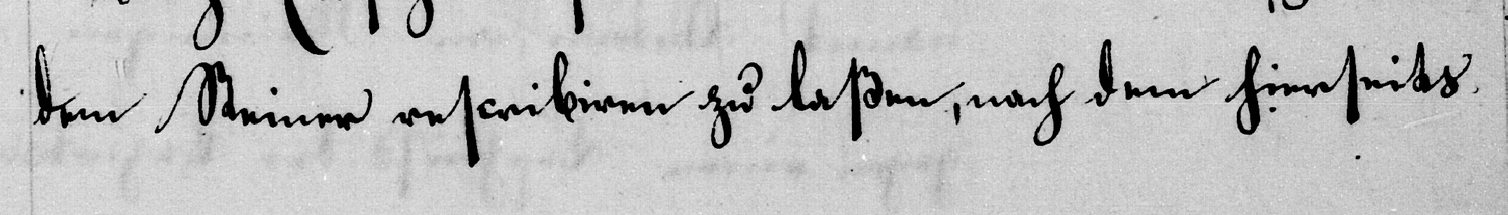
dem Steiner rescribiren zu laßen, nach dem hierseits
